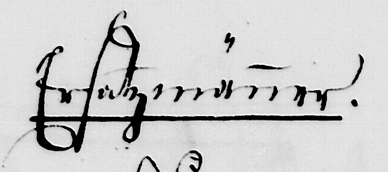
Ersatzmänner.
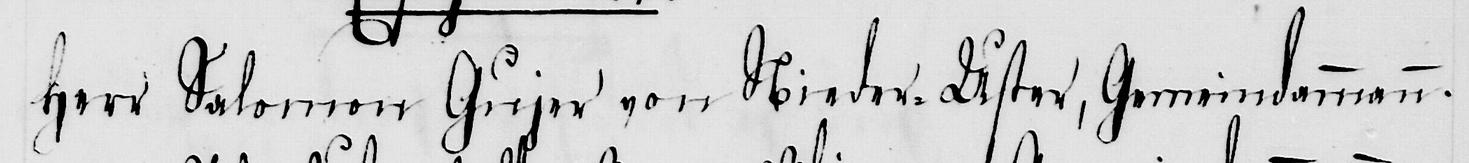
Herr Salomon Gujer von Nieder-Uster, Gemeindammann.
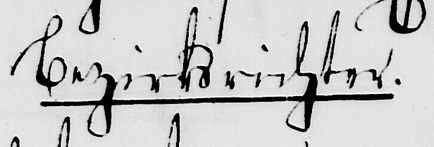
Bezirksrichter.
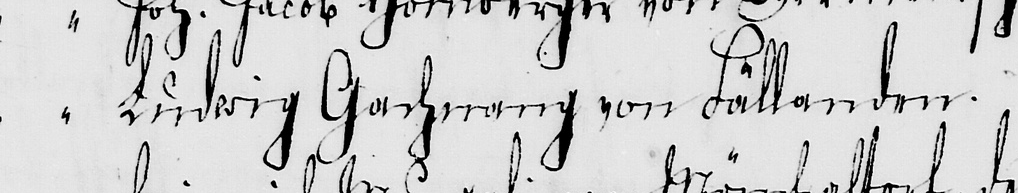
“ Ludwig Gachnang von Fällanden.
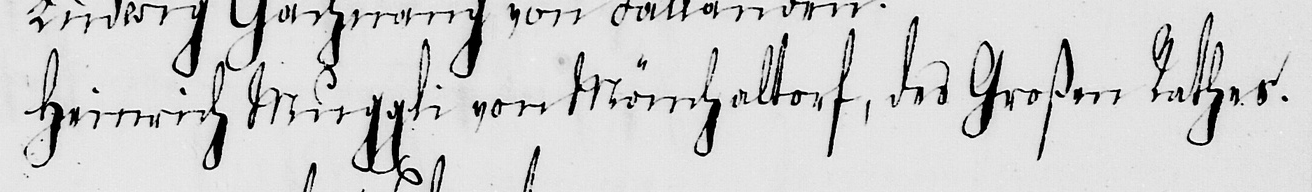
Heinrich Muggli von Mönchaltorf, des Großen Rathes.
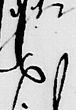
s.
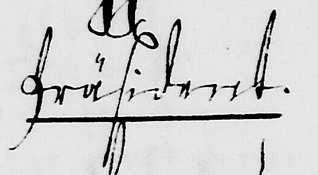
Präsident.
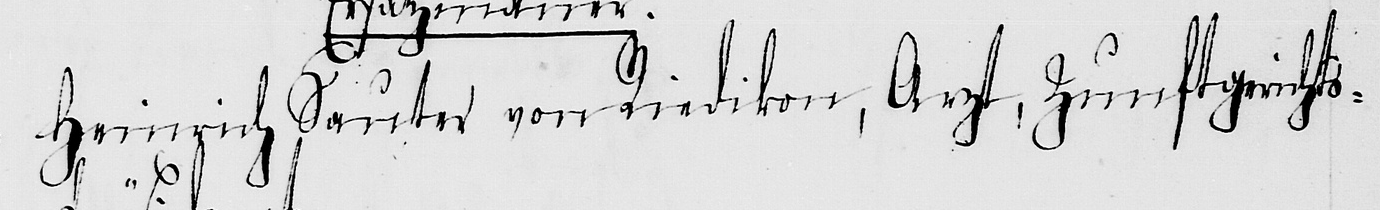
Heinrich Sauter von Riedikon, Arzt, Zunftgericht¬
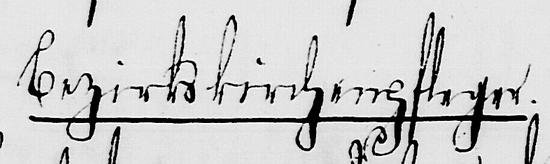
Bezirksschulpfleger.
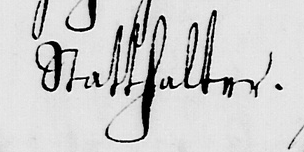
Statthalter.
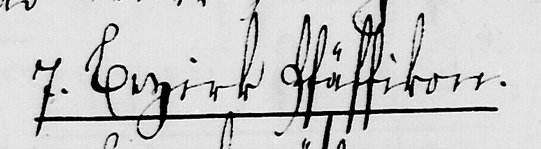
7. Bezirk Pfäffikon.
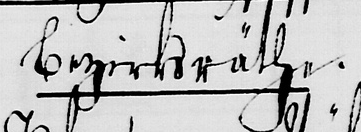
Bezirksräthe.
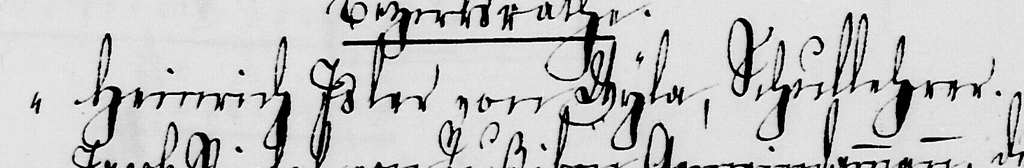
“ Heinrich Isler von Wyla, Schullehrer.
